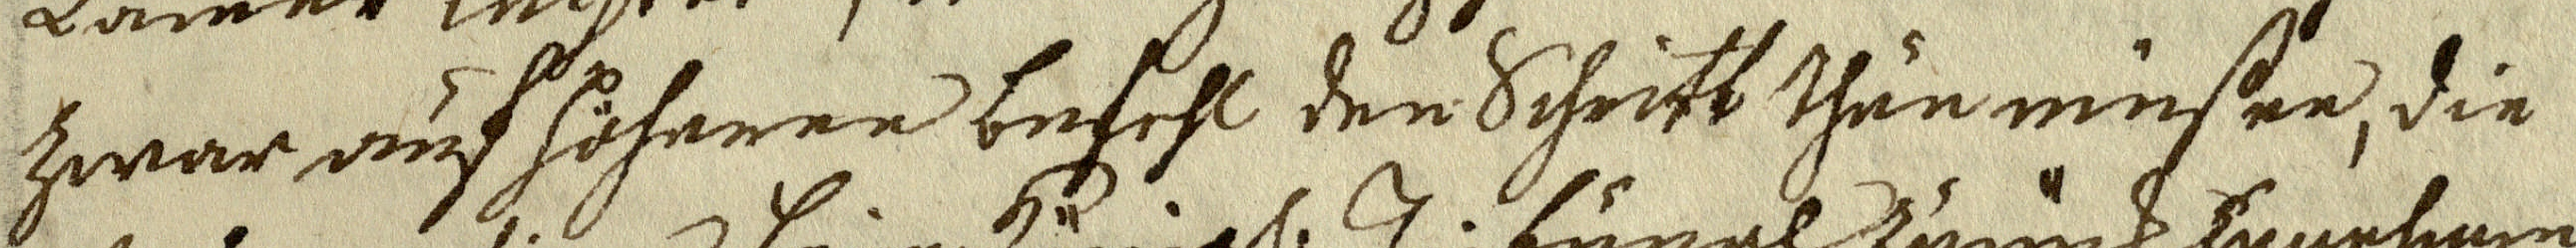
zwar auf höheren Befehl den Schritt thun müßen, die
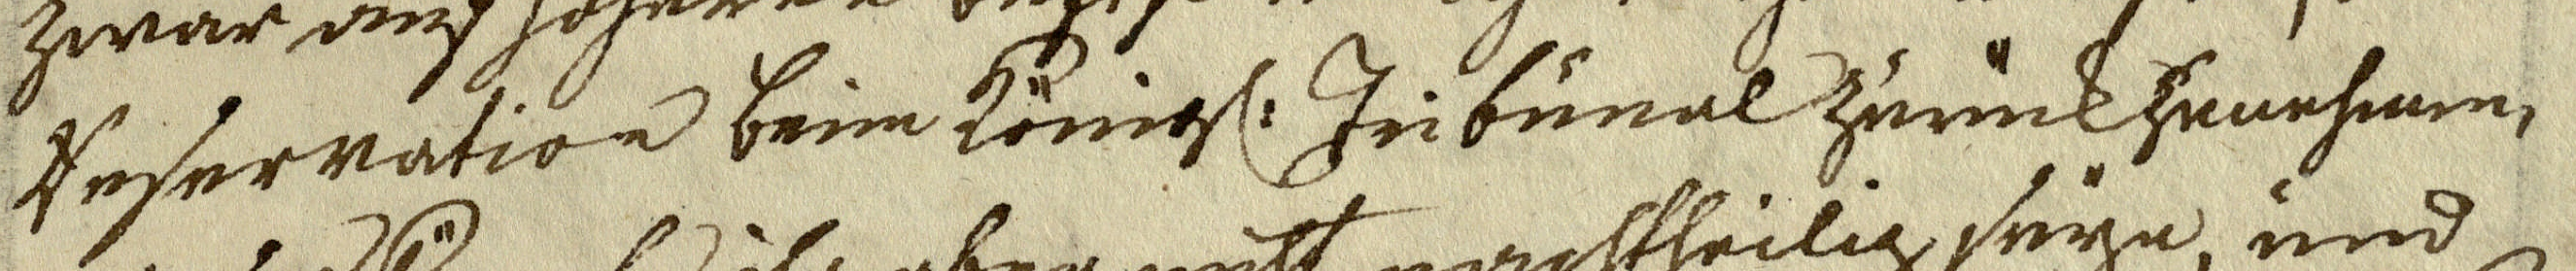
Reservation beim Königl. Tribunal zurück zunehmen,
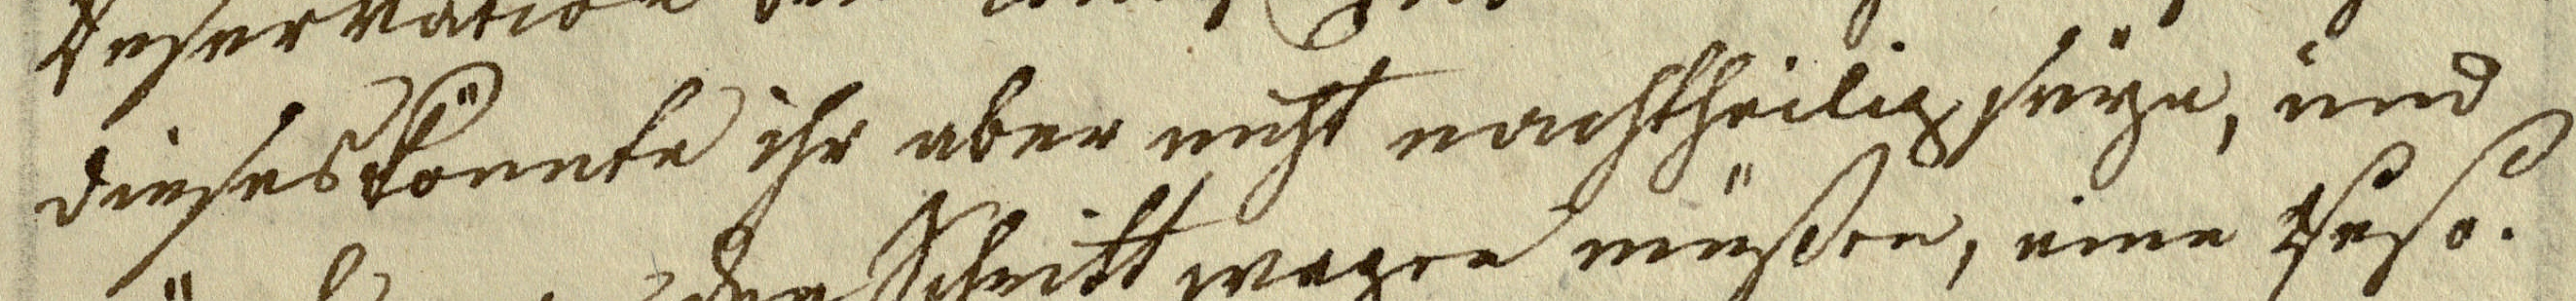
diese könnte ihr aber nicht nachtheilig seÿn, und
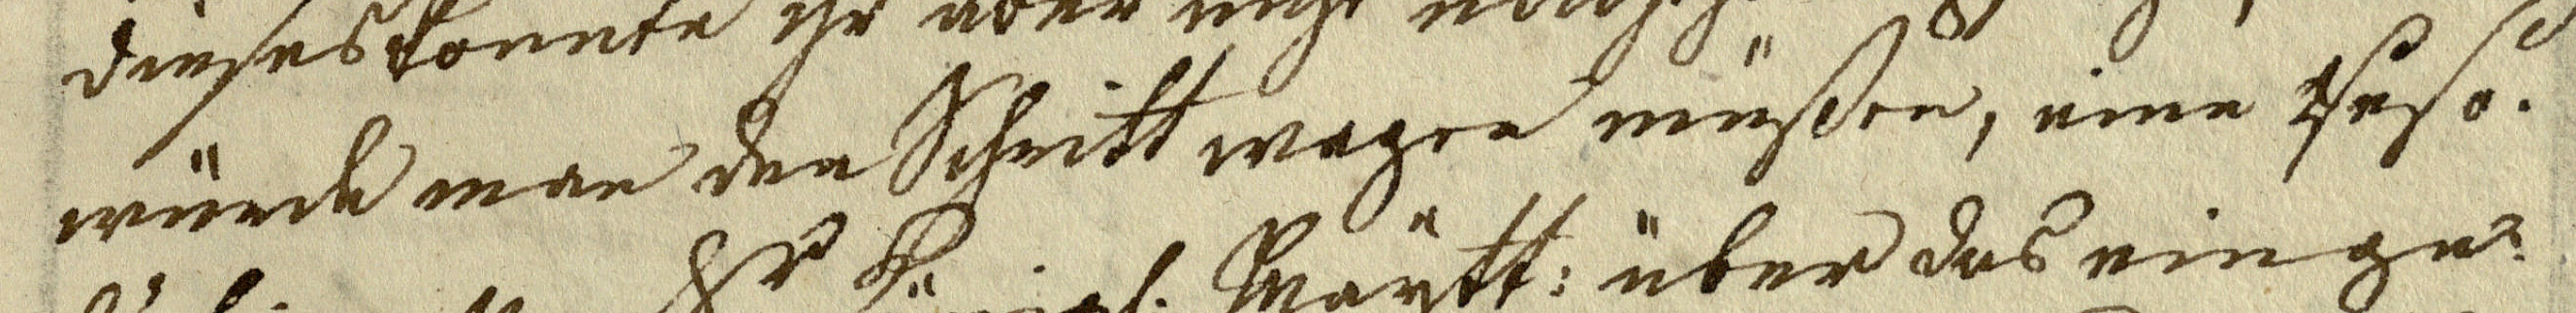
würde man den Schritt wagen müssen, eine Reso¬
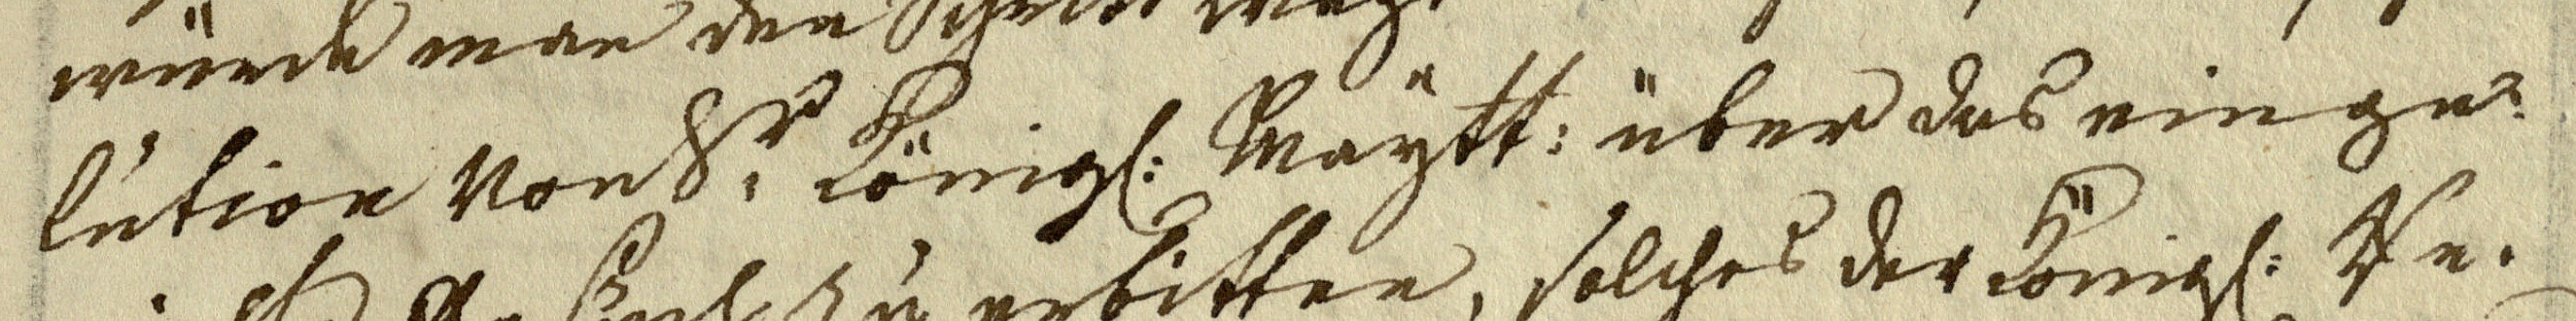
lution von Sr Königl. Maÿtt. über das einge¬
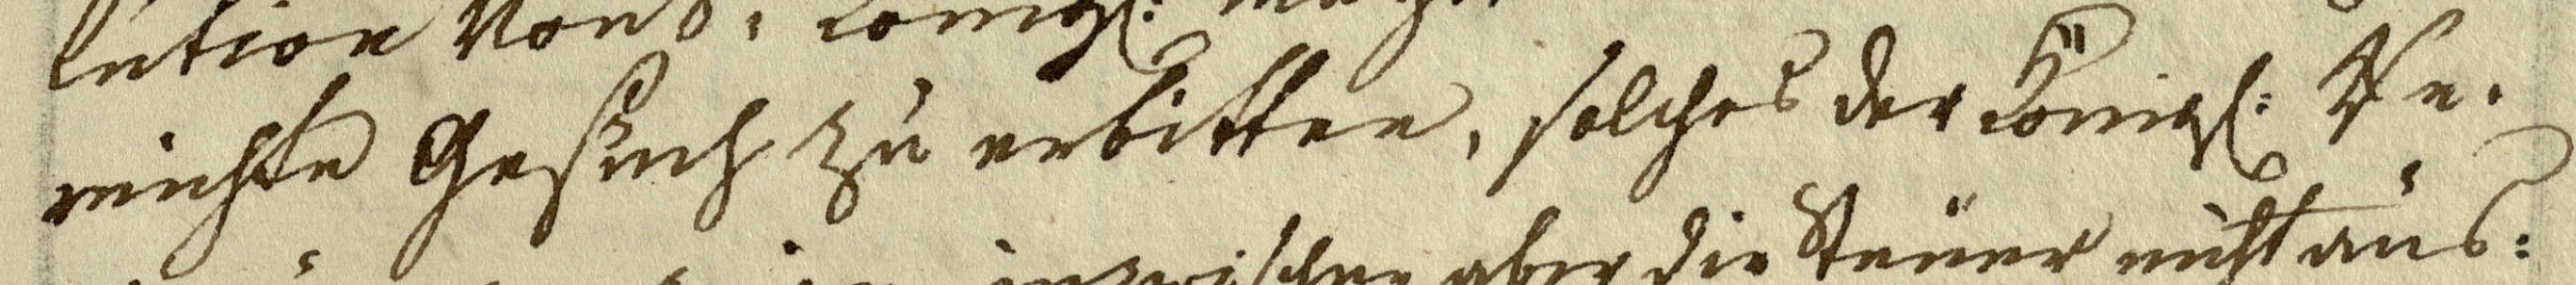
reichte Gesuch zu erbitten, solches der Königl. Re¬
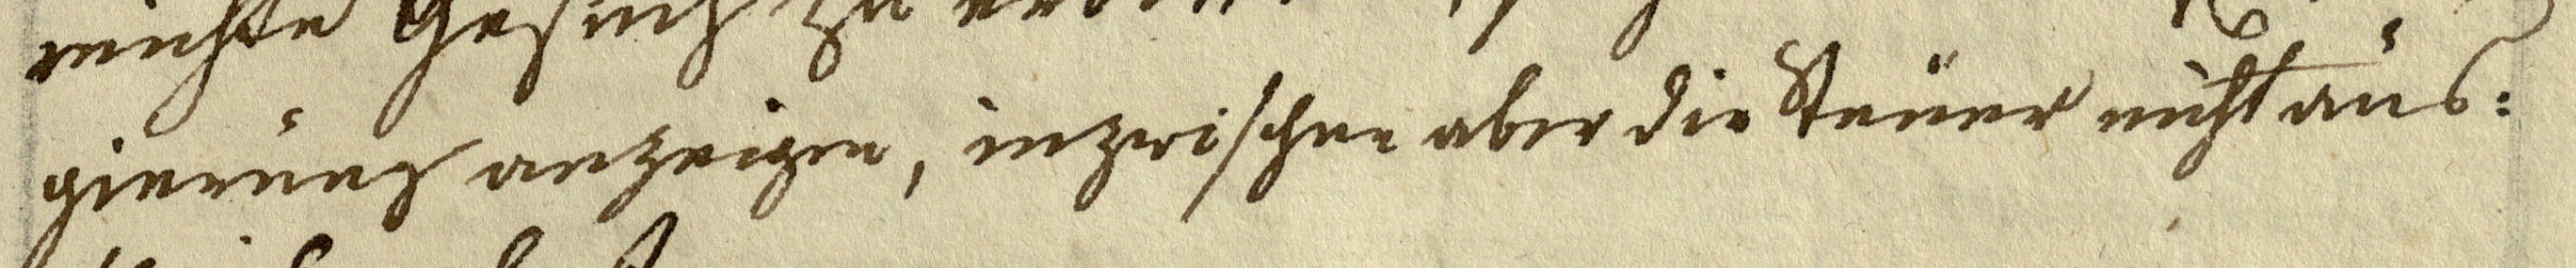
gierung anzeigen, inzwischen aber die Steuer nicht aus¬
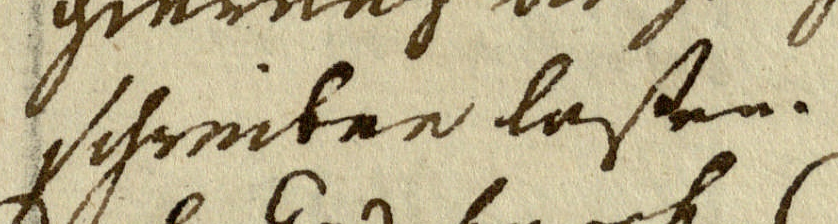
schreiben laßen.
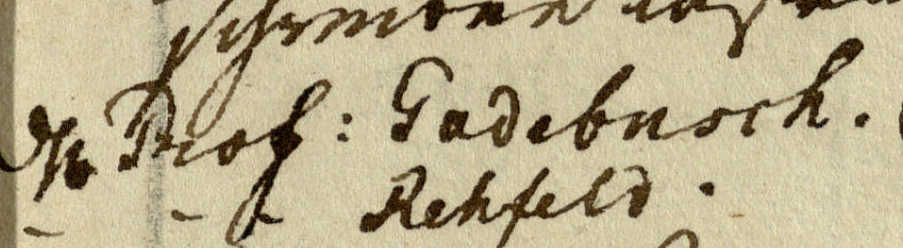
dh. Prof. Gadebusch
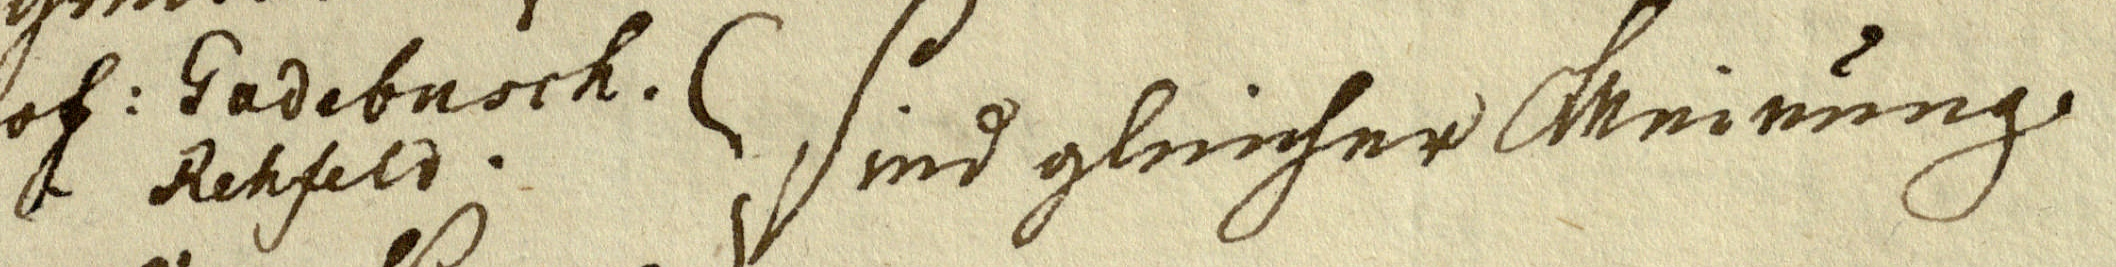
Rehfeld. sind gleicher Meinung.
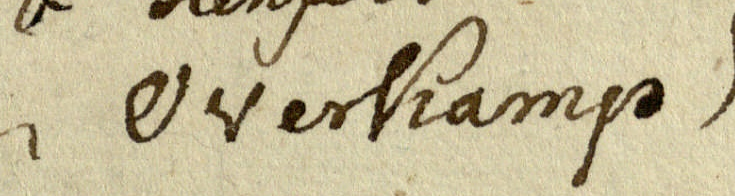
Overkamp
